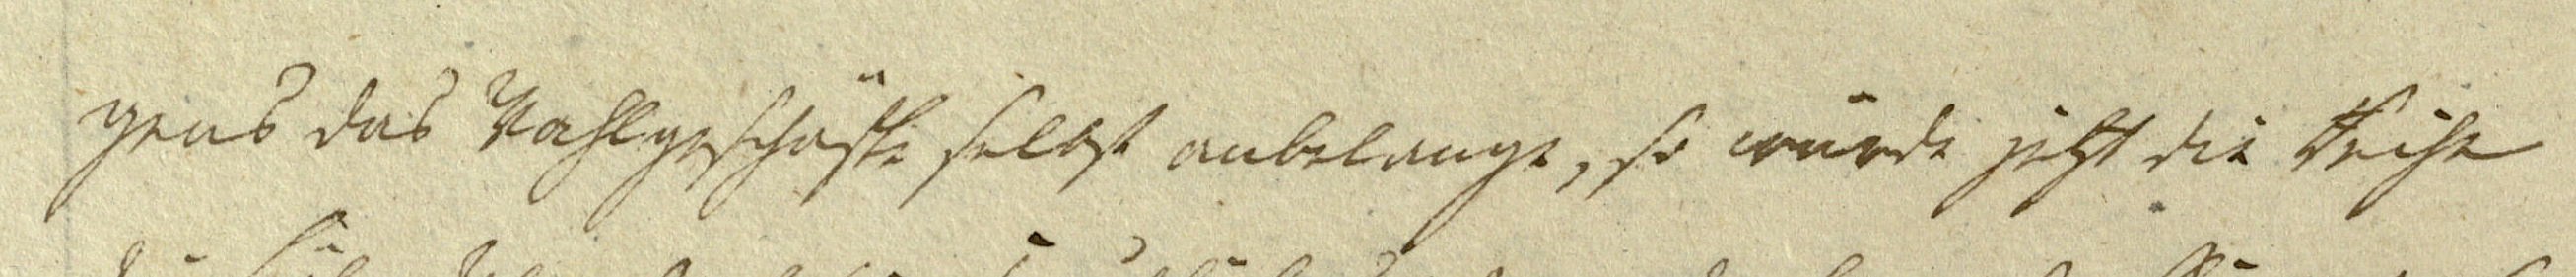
gens das Wahlgeschäfte selbst anbelange, so würde jetzt die Reihe
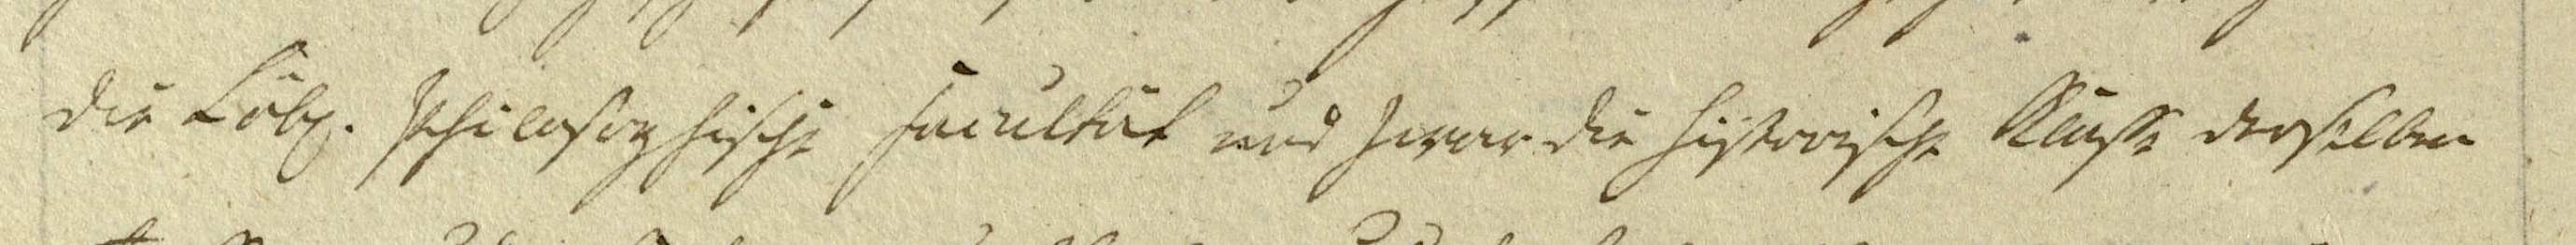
die Löbl. Philosophische Facultät und zwar die historische Klasse derselben
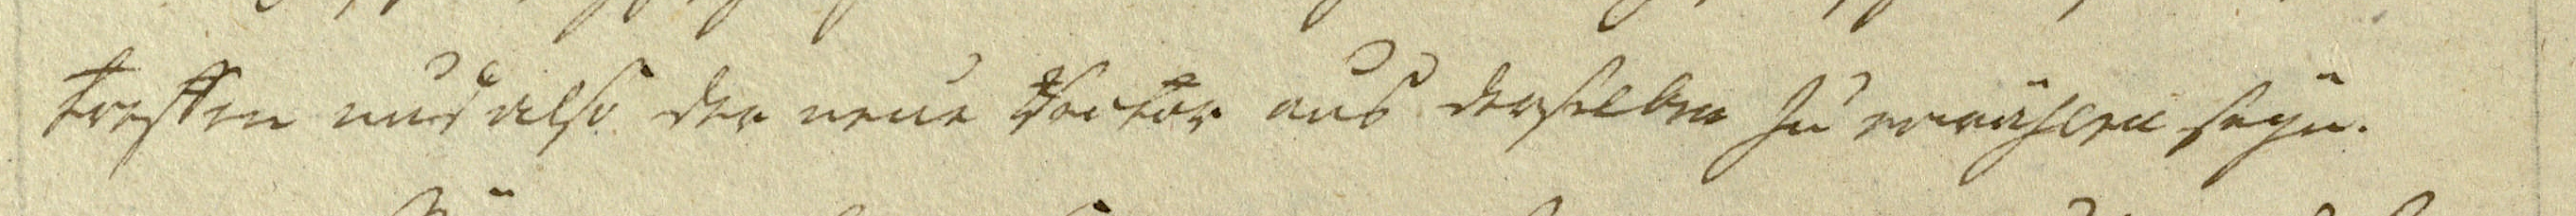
treffen und also der neue Rector aus derselben zu erwählen seÿn.
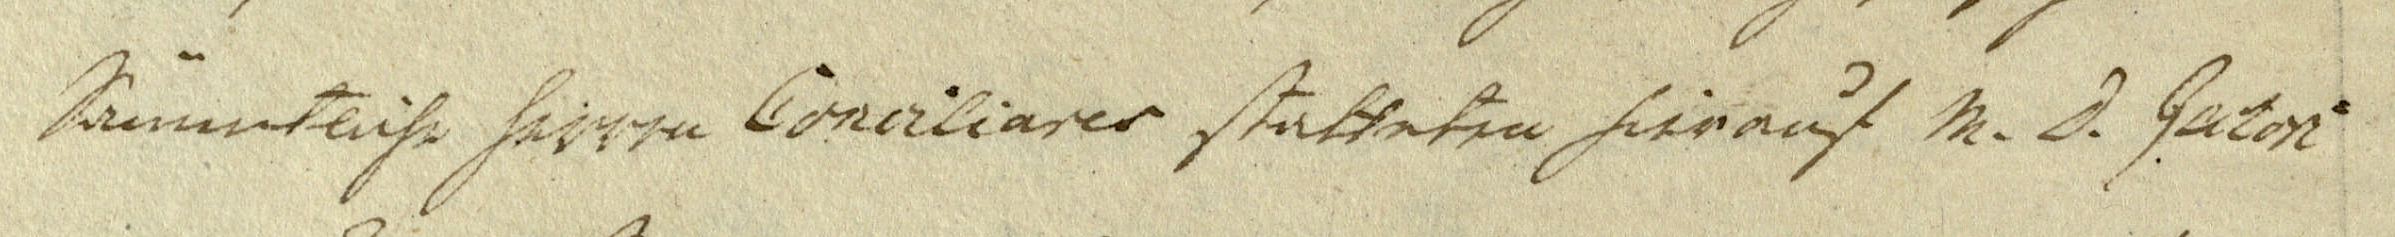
Sämmtliche Herren Conciliares statteten hierauf M. D. Rectori
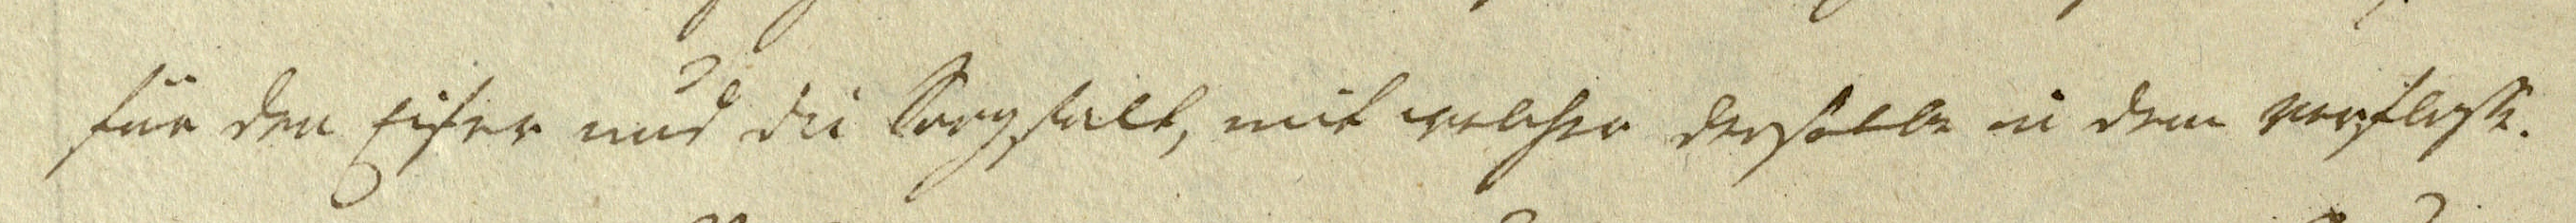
für den Eifer und die Sorgfalt, mit welcher derselbe in dem verflosse¬
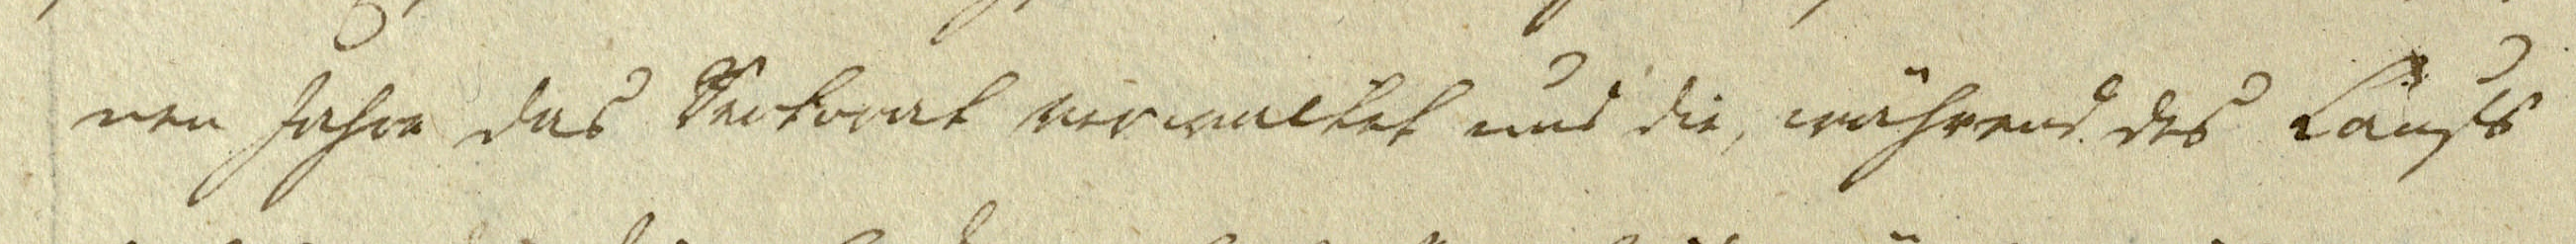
nen Jahre das Rectorat verwaltet und die während des Laufs
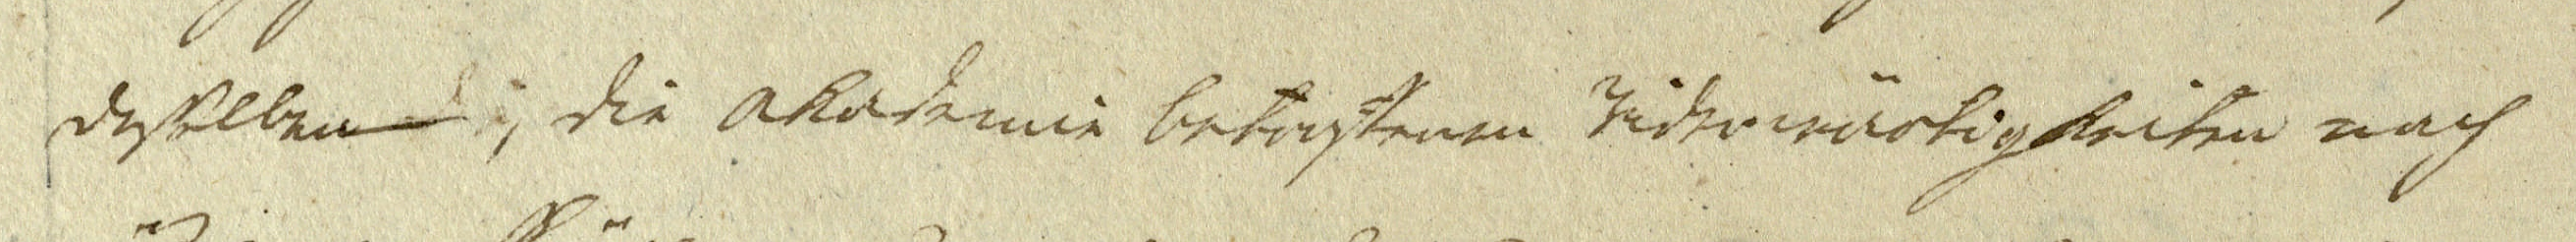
desselben, die Akademie betroffenen Widerwärtigkeiten nach
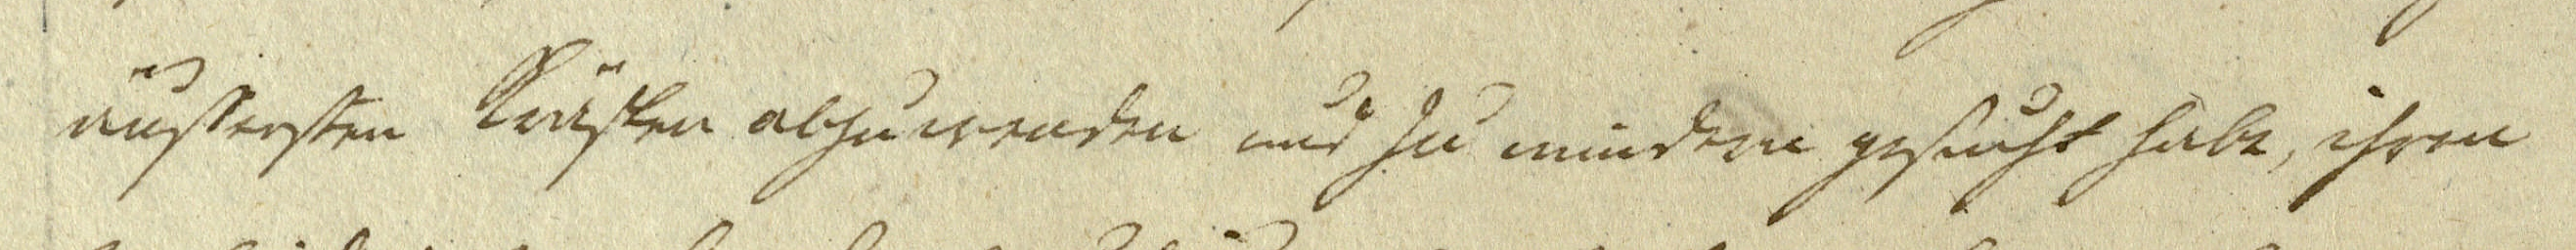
äussersten Kräften abzuwenden und zu mindern gesucht habe, ihren
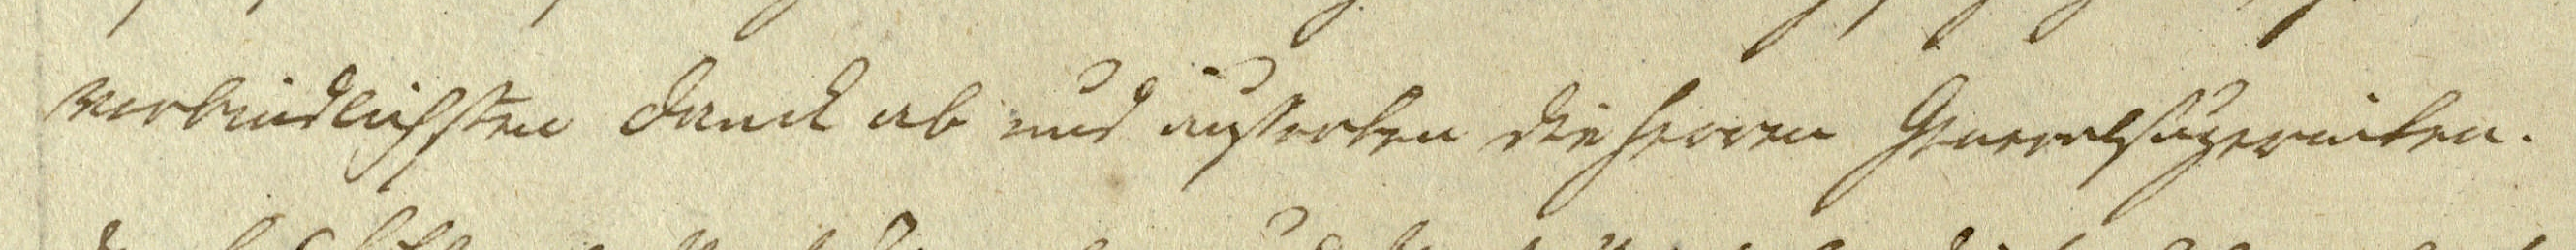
verbindlichsten Danck ab und äussersten die Herren Generalsuperinten¬
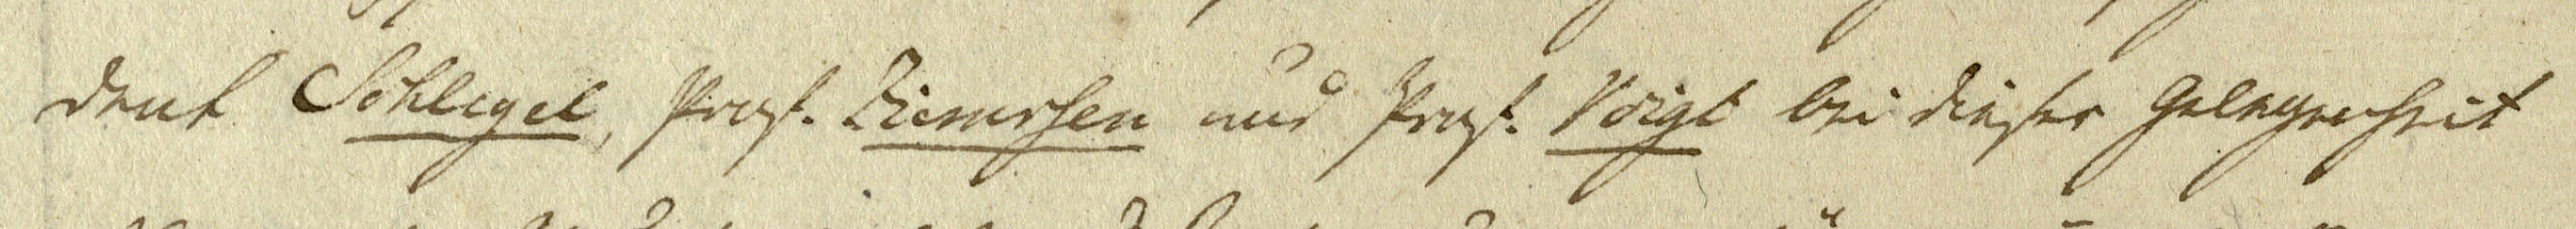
dent Schlegel, Prof. Ziemssen und Prof. Voigt bei dieser Gelegenheit
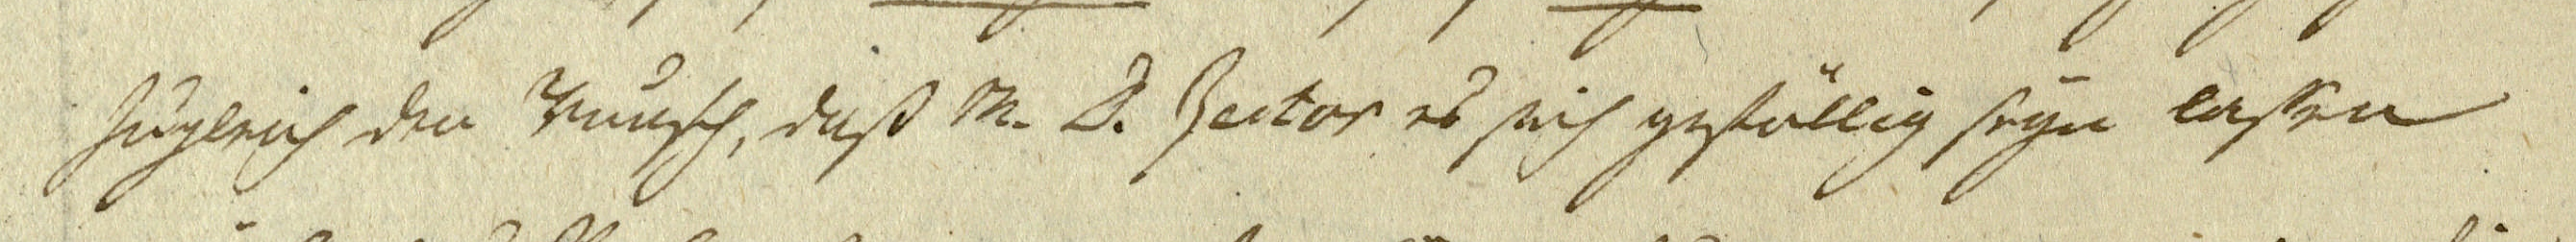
zugleich den Wunsch, daß M. D. Rector es sich gefällig seÿn lassen
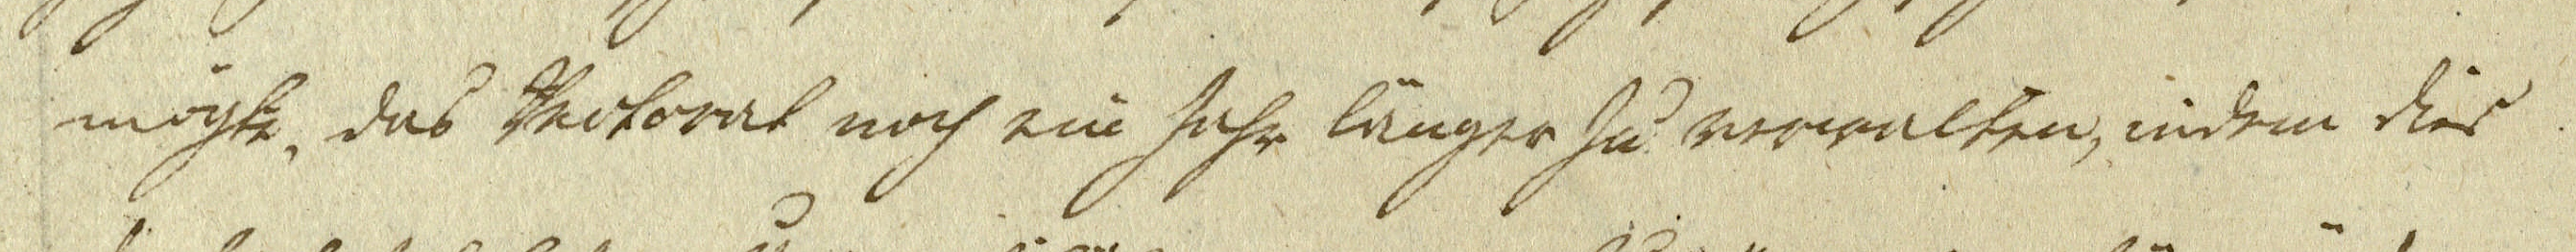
mögte, das Rectorat noch ein Jahr länger zu verwalten, indem dies
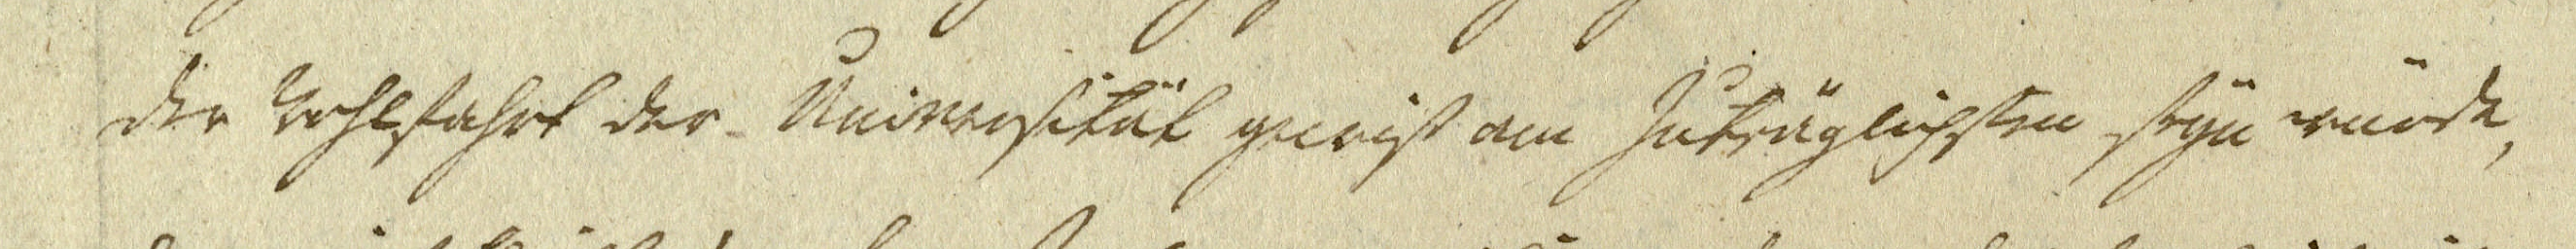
der Wohlfahrt der Universität gewiß am zuträglichsten seÿn würde,
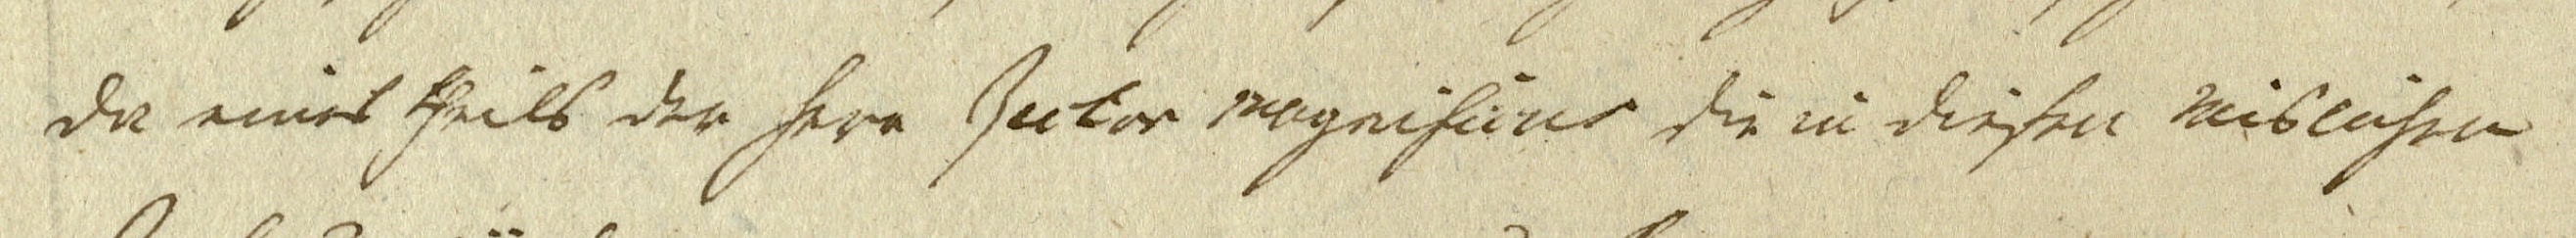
da eines theils der Herr Rector Magnificus die in diesen mislichen
